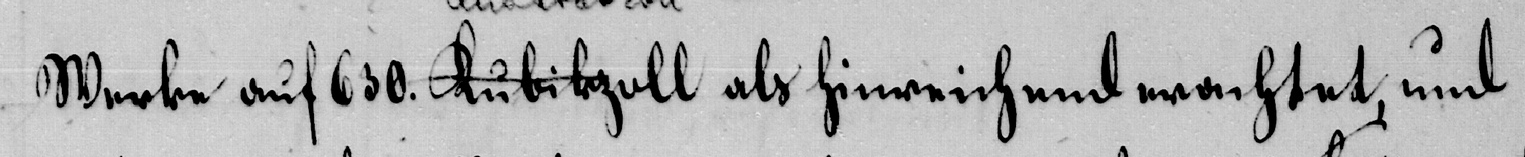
Werke auf 630. Kubikzoll als hinreichend erachtet, und
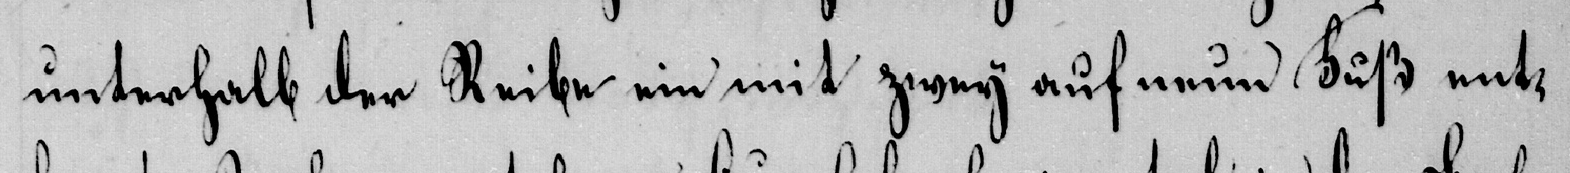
unterhalb der Reibe ein mit zwey auf neun Fuß ent¬
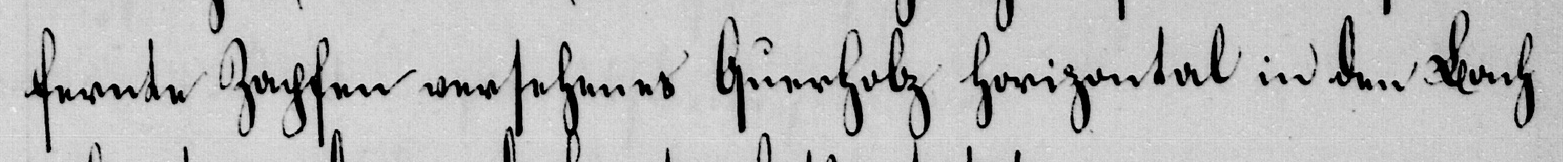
fernte Zapfen versehenes Querholz horizontal in den Bach
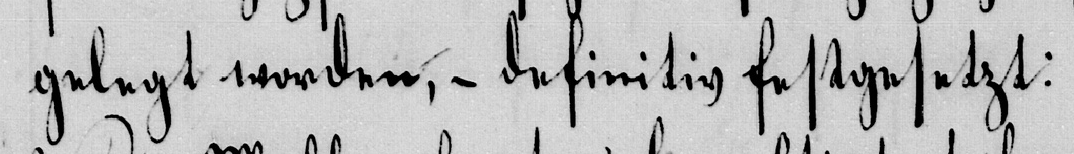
gelegt werden, – definitiv festgesetzt:
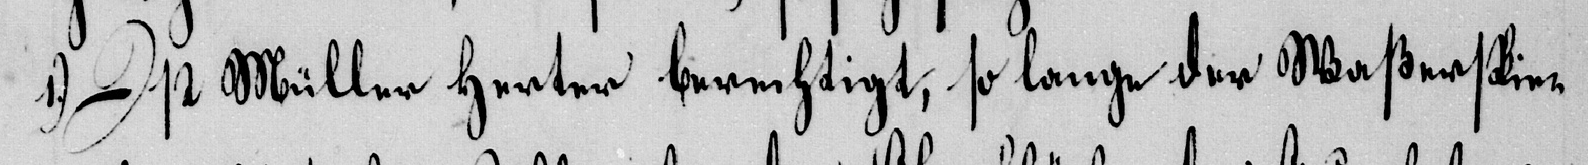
1.) Ist Müller Herter berechtigt, so lange der Waßerspie¬
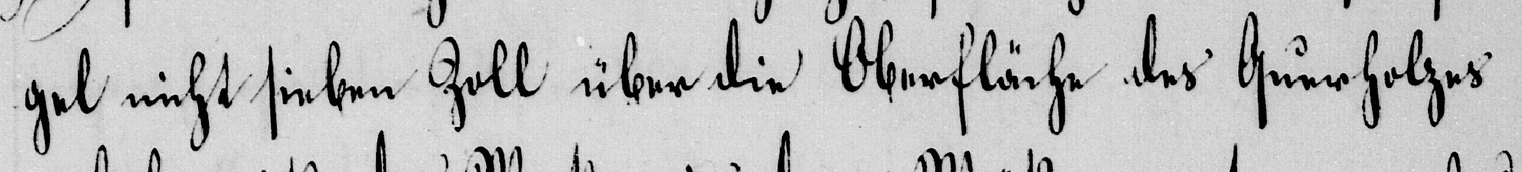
gel nicht sieben Zoll über die Oberfläche des Querholzes
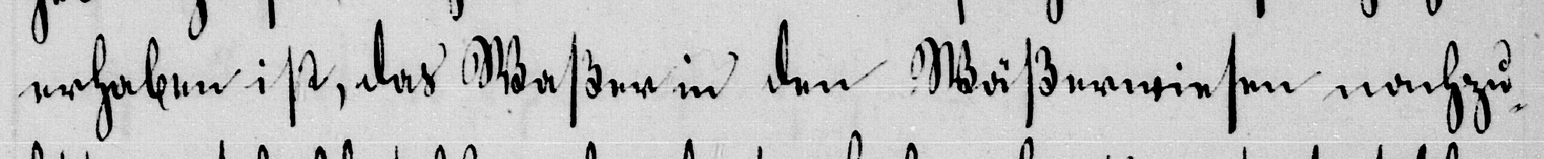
erhaben ist, das Waßer in den Wäßerwiesen nachzu¬
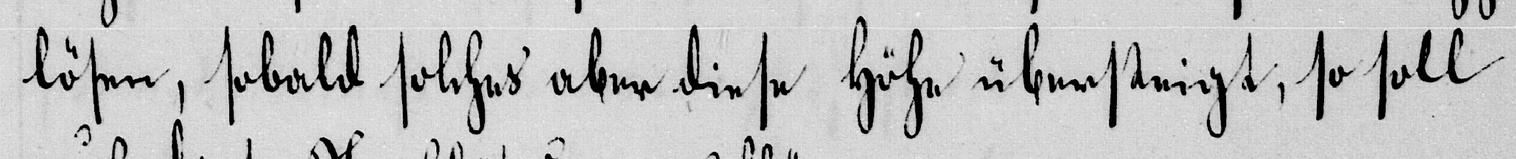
lösen, sobald solches aber diese Höhe übersteigt, so soll
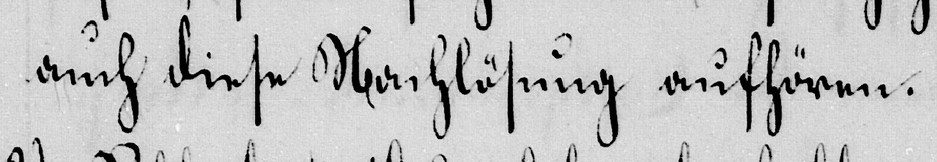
auch diese Nachlösung aufhören.
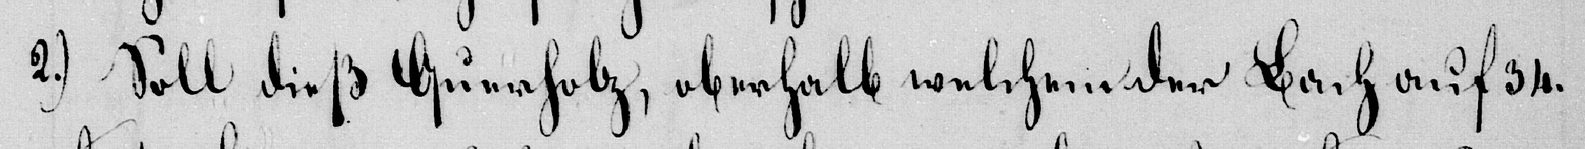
2.) Soll dieß Querholz, oberhalb welchem der Bach auf 34.
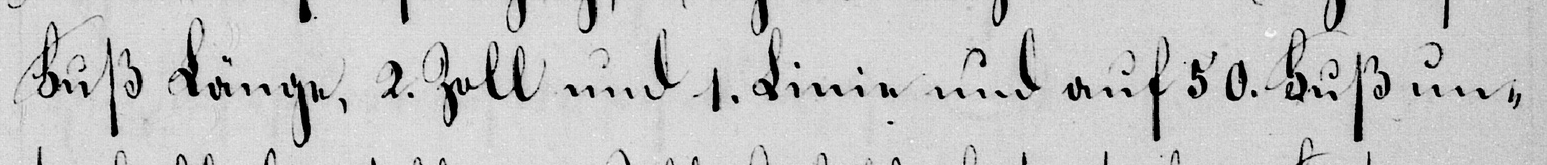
Fuß Länge, 2. Zoll und 1. Linie und auf 50. Fuß un¬
